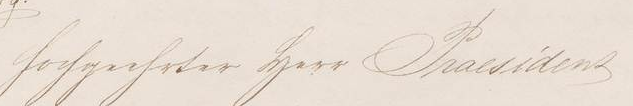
Hochgeehrter Herr Praesident!
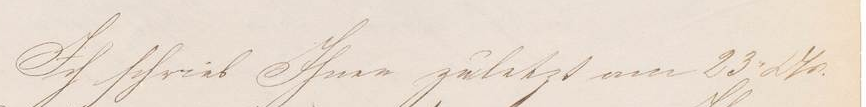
Ich schrieb Ihnen zuletzt am 23 dss.
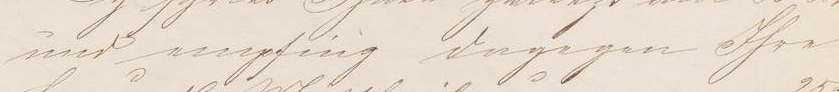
und empfing dagegen Ihre
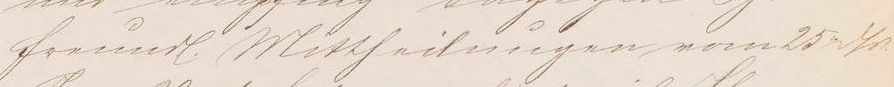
freundl. Mittheilungen vom 25 dss.
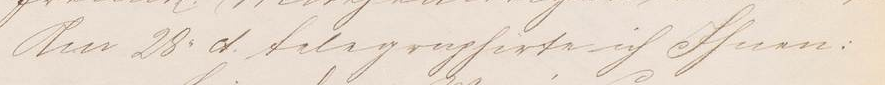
Am 28 d. telegraphirte ich Ihnen:
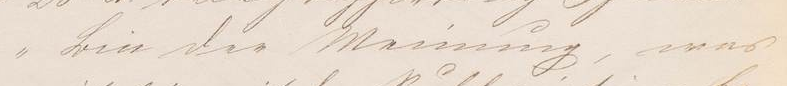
«Bin der Meinung, was
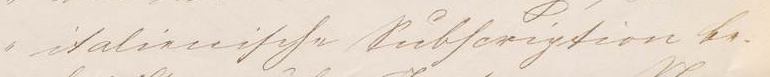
italienische Subscription be-
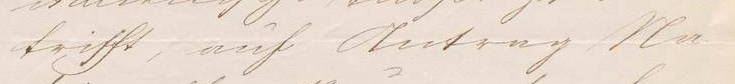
trifft, auf Antrag Na-
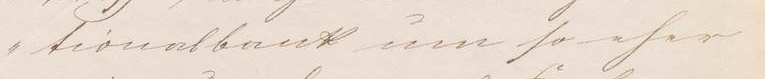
tionalbank um so eher
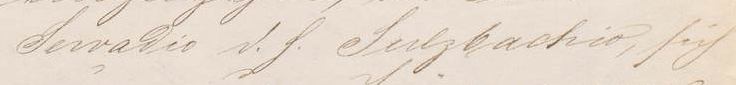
Servadio d. h. Sulzbachio, sich
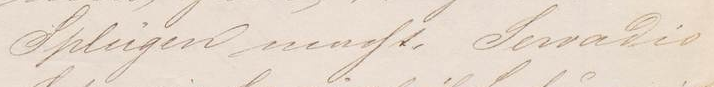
Splügen macht. Servadio
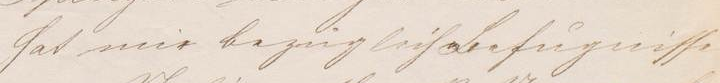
hat mir bezüglich Befugnisse
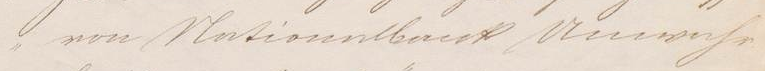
von Nationalbank Unwahr-
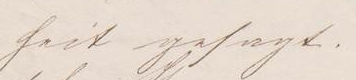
heit gesagt.»
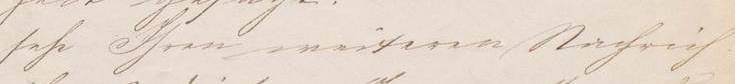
sehe Ihren weiteren Nachrich-
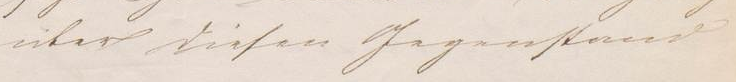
über diesen Gegenstand
